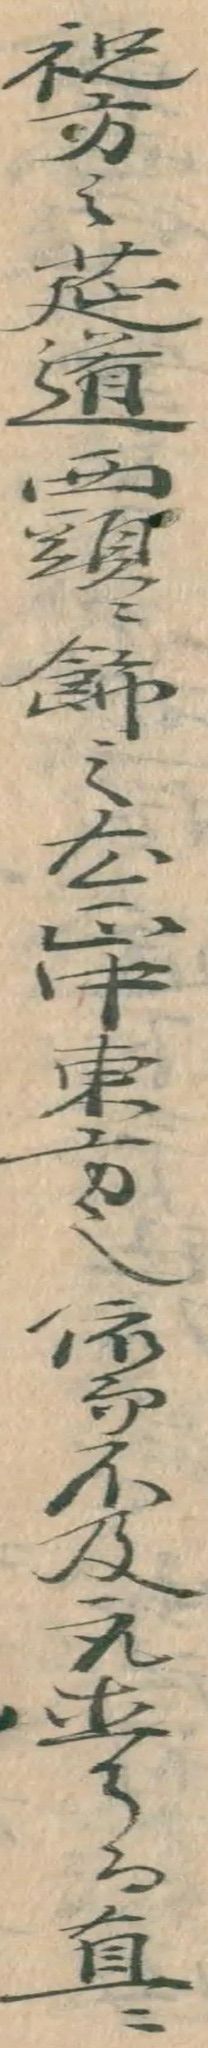祝方之莚道西頭に飾之尤正中東方也依而不及取直了直に
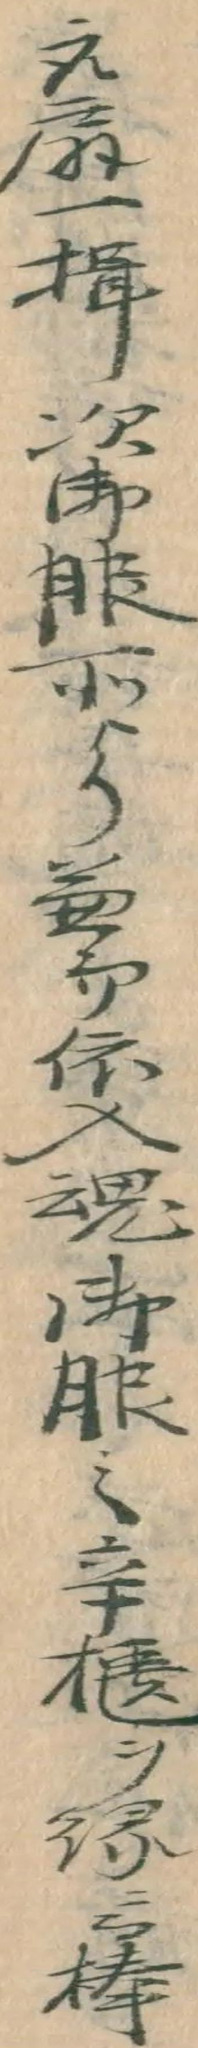取扇一揖次御服所より兼而依入魂御服之辛櫃ヲ縁ニ而棒

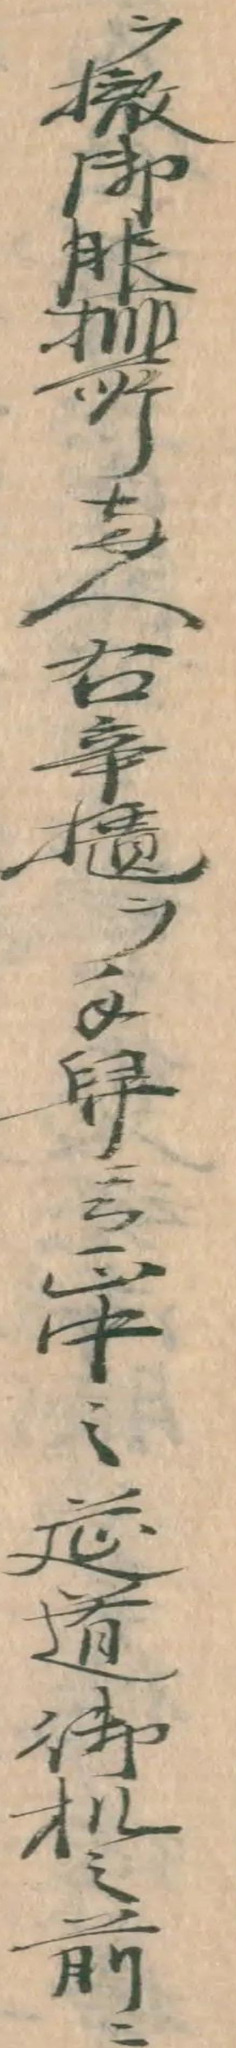ヲ撤御服所両人古辛櫃ヲ手舁ニ而正中之筵道御机之前ニ
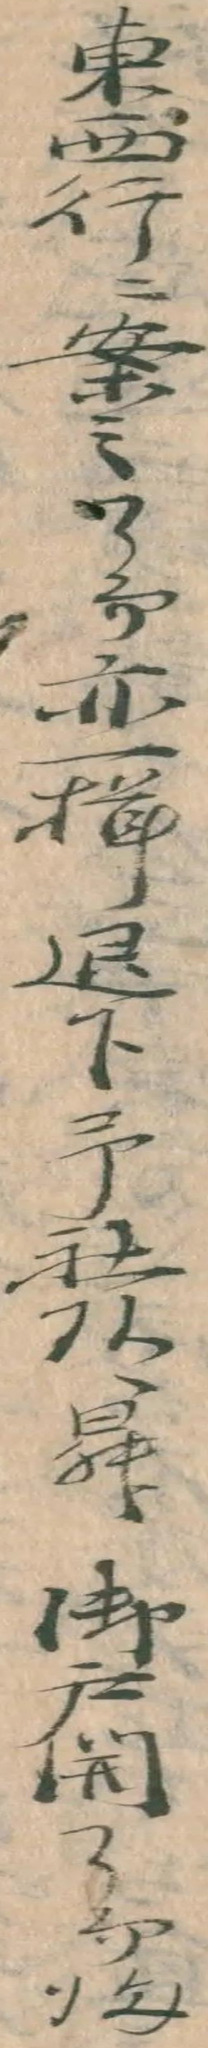東西行二案之了而亦一揖退下予社頭へ昇御戸開了而帰
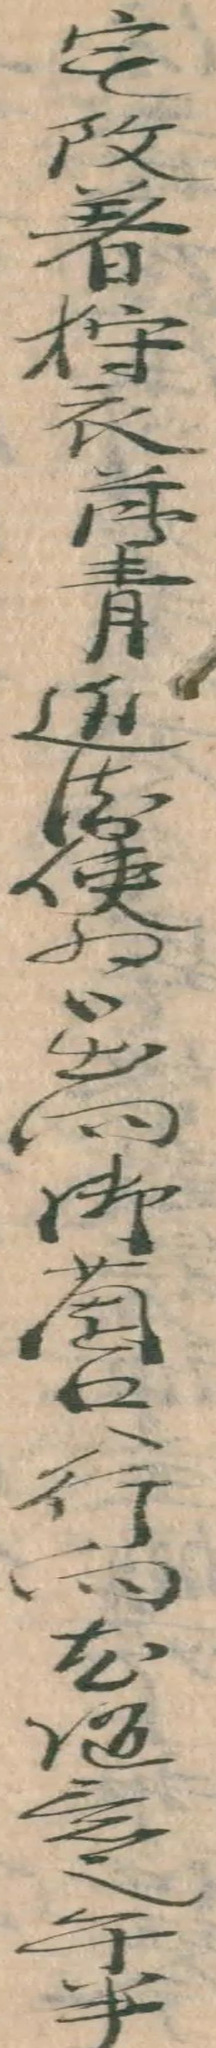宅改着狩衣薄青近衛使為御出向御薗口へ行向尤随意也午半
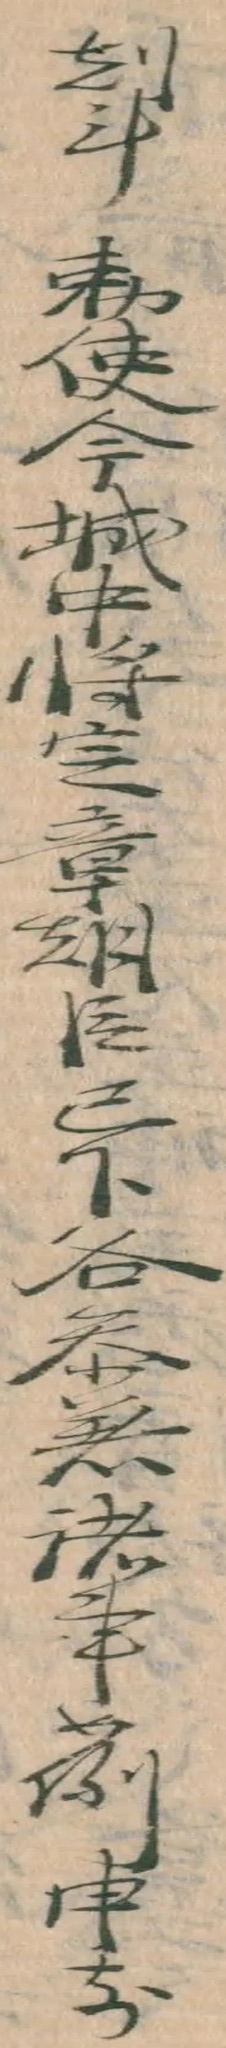刻斗勅使今城中将定章朝臣已下各参着諸事如例申前
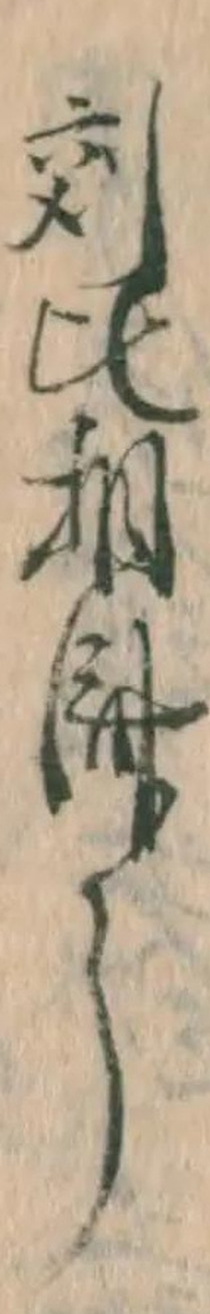刻比相済了
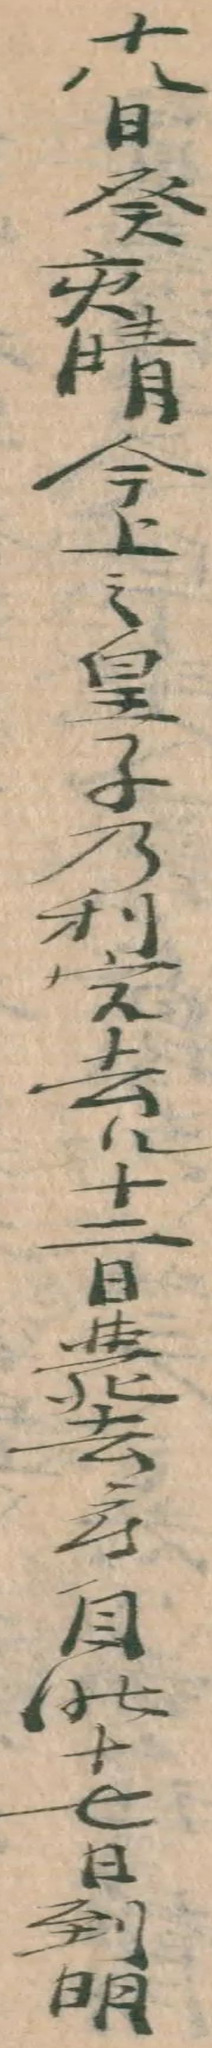十八日癸亥晴今上之皇子乃利宮去ル十二日薨去ニ付自頃十七日到明
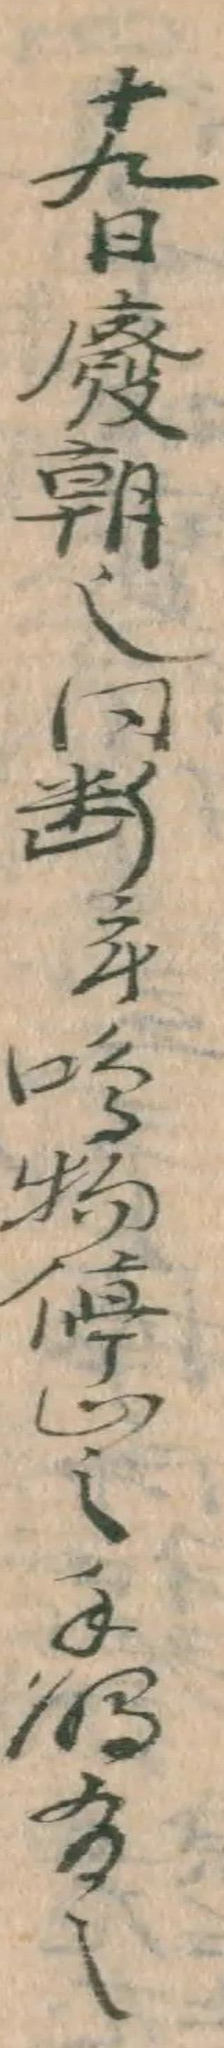十九日廃朝也同断ニ付鳴物停止之手触有之
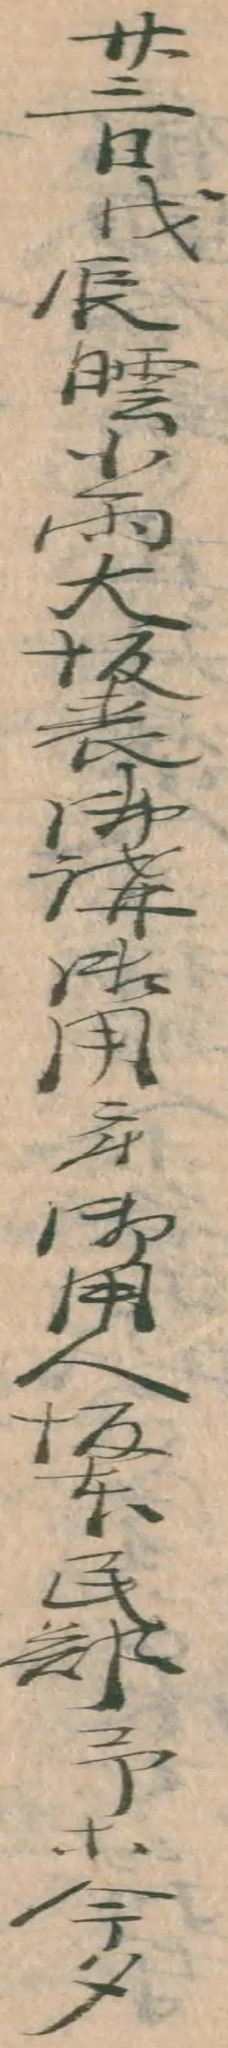廿三日戊辰晴小雨大坂表御講御用ニ付御用人坂本民部予等今夕
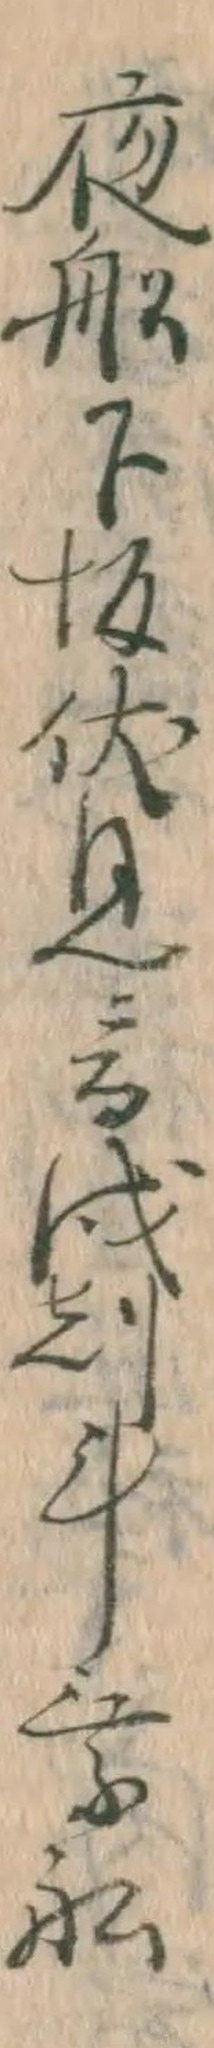夜舩下坂伏見ニ而戌刻斗乗舩
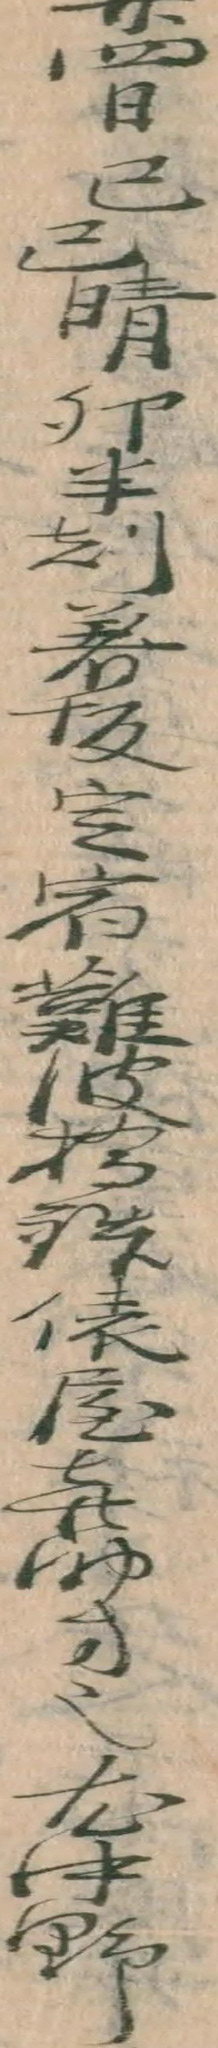廿四日己巳晴卯半刻着坂定宿難波橋詰俵渡喜助方也尤中野
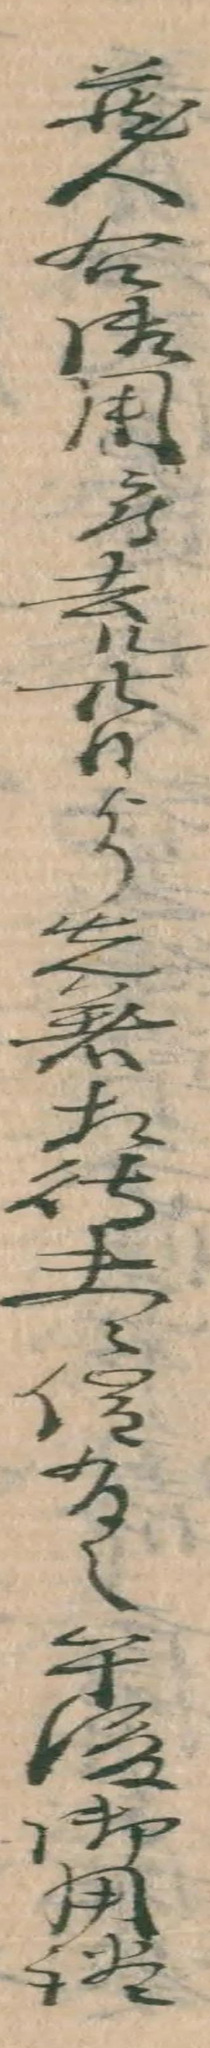蔵人右御用ニ付去ル廿日より先着相待夫々催有之午後御用談
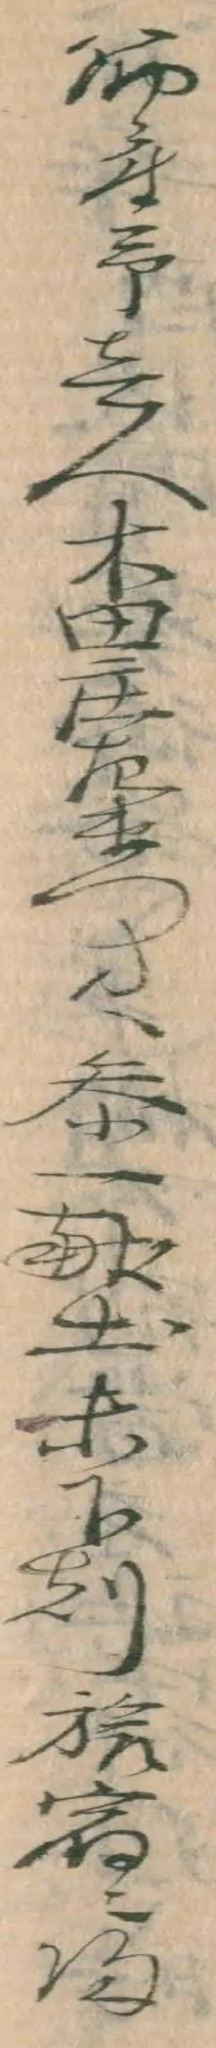筋ニ付予壱人木田庄左衛門方へ参一献出未下刻旅宿ニ帰
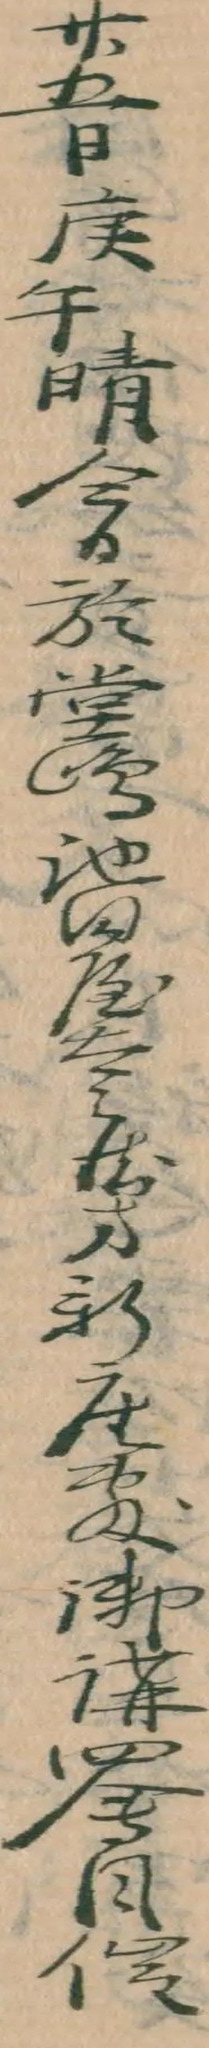廿五日庚午晴今日於堂嶋池田屋太兵衛方新座敷御講四會目催
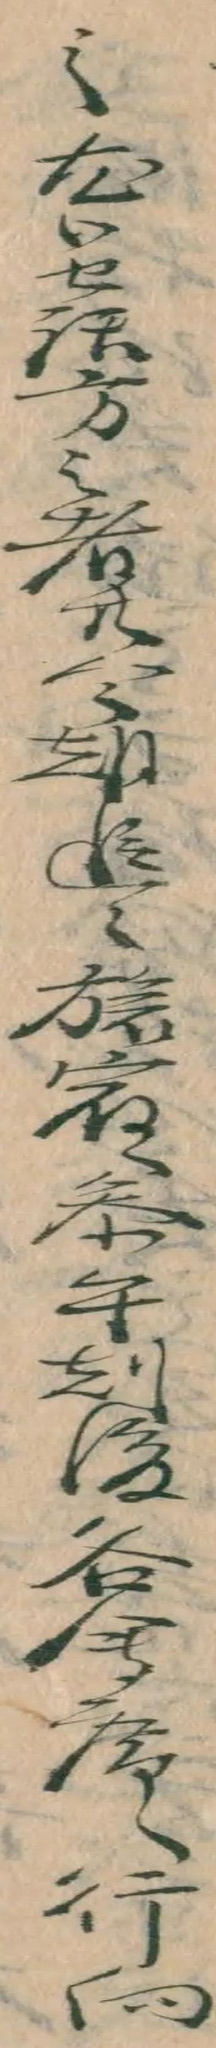之尤御世話方之者共今朝追々旅宿へ参午刻後各會席へ行向
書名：賀茂社記録. 第65冊
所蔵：国立国会図書館 National Diet Library, JAPAN
